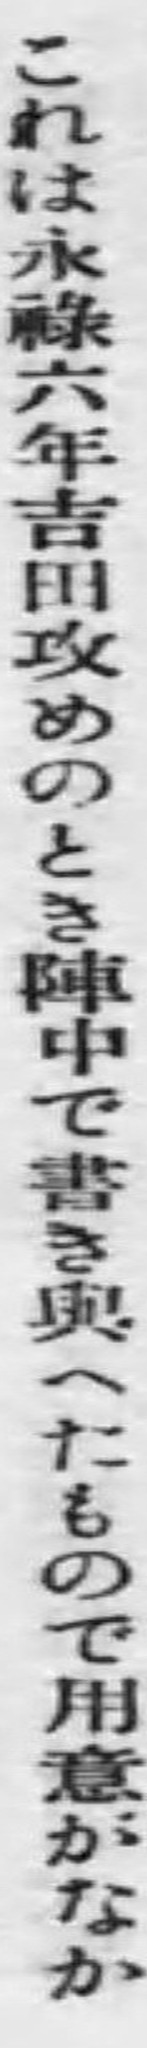これは永禄六年吉田攻めのとき陣中で書き与へたもので用意がなか
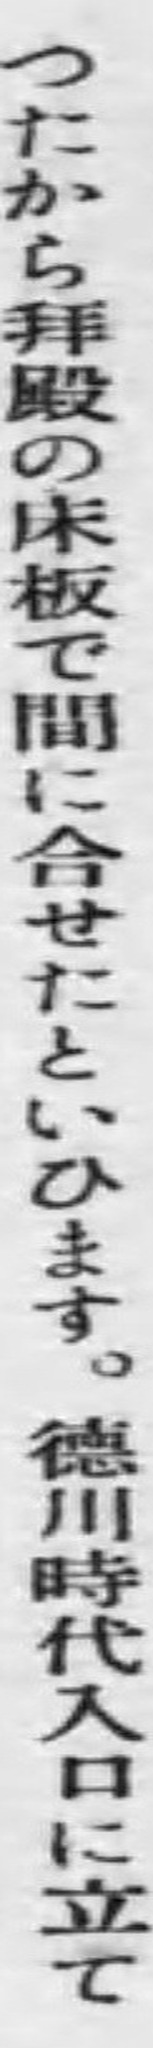つたから拝殿の床板で間に合せたといひます。徳川時代入口に立て
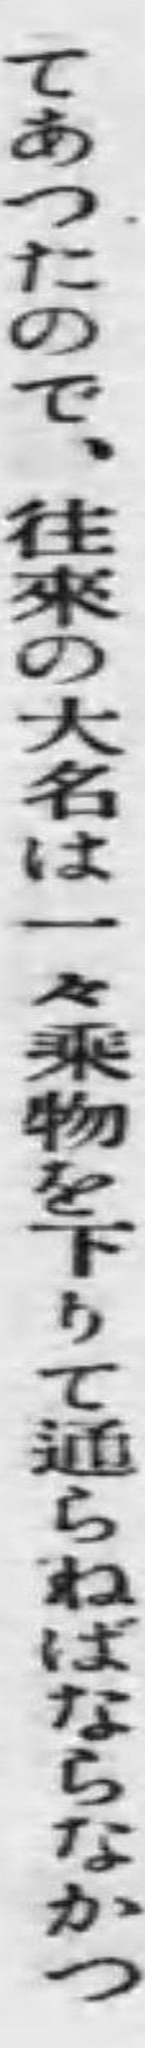てあつたので、往来の大名は一々乗物を下りて通らねばならなかつ
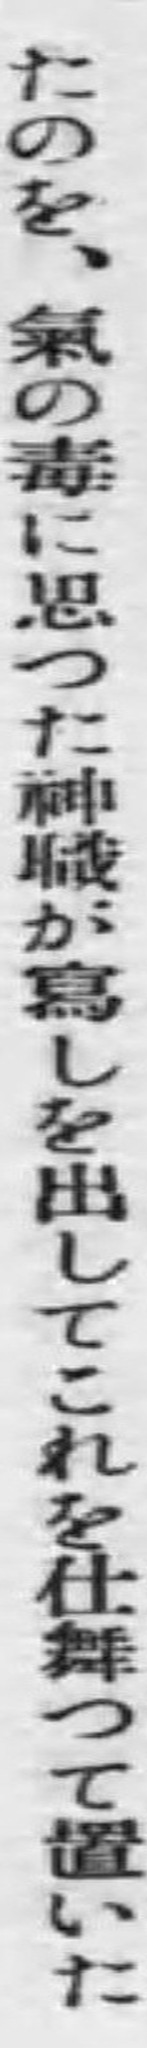たのを、気の毒に思つた神職が写しを出してこれを仕舞つて置いた
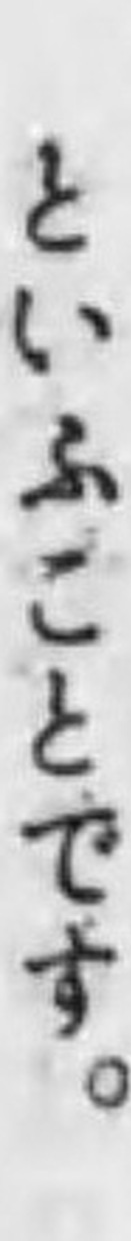といふことです。
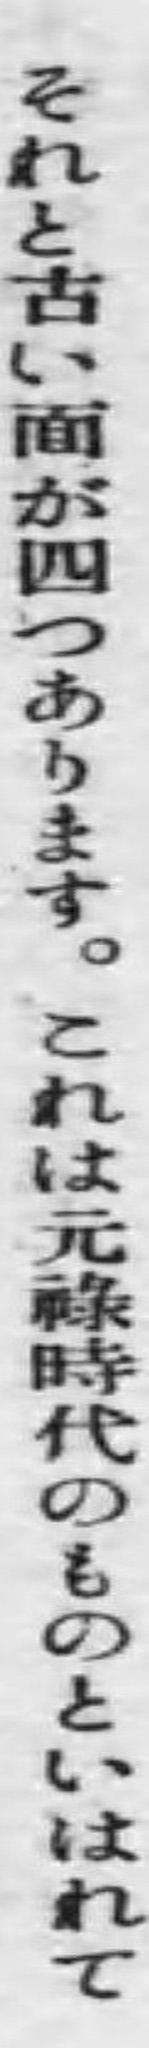それと古い面が四つあります。これは元禄時代のものといはれて
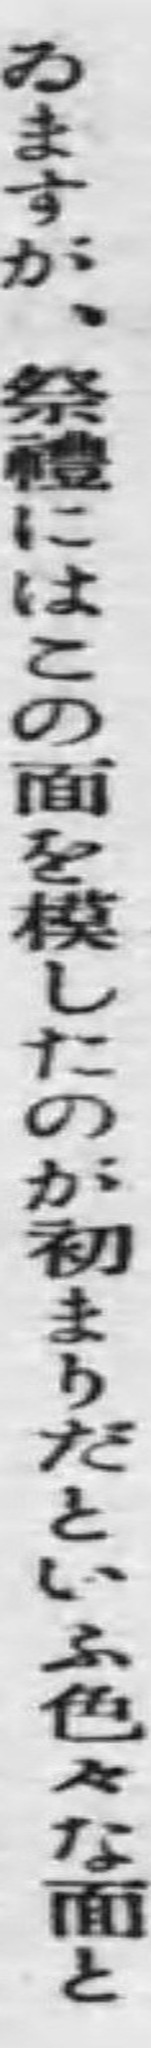ゐますが、祭礼にはこの面を模したのが初まりだといふ色々な面と
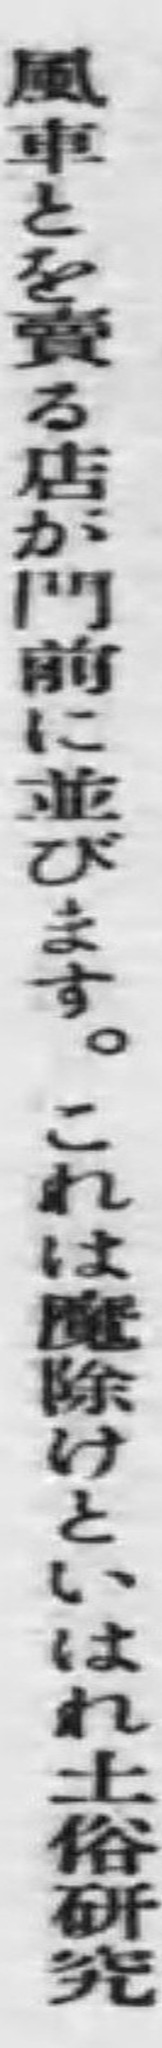風車とを売る店が門前に並びます。これは魔除けといはれ土俗研究
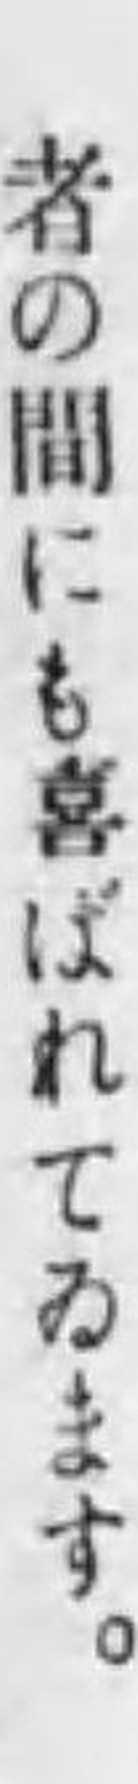者の間にも喜ばれてゐます。
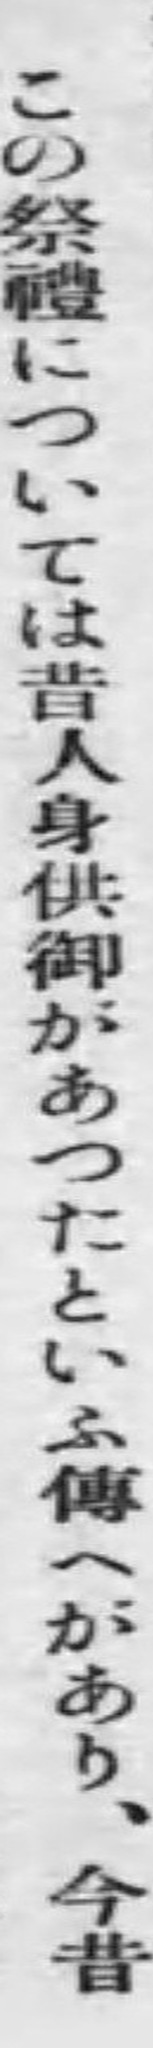この祭礼については昔人身供御があつたといふ伝へがあり、今昔
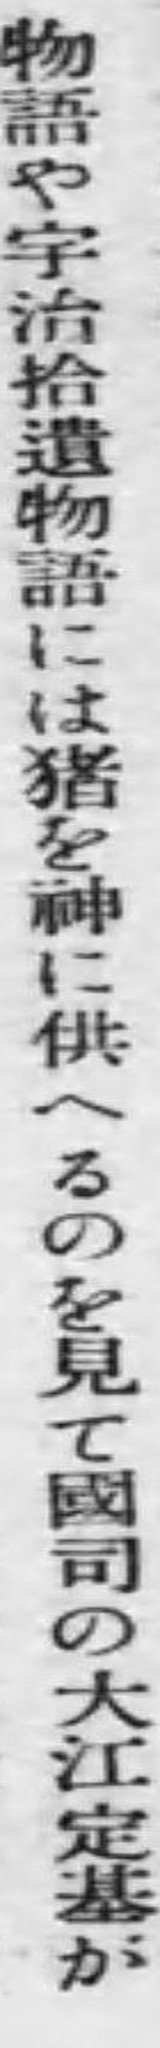物語や宇治拾遺物語には猪を神に供へるのを見て国司の大江定基が
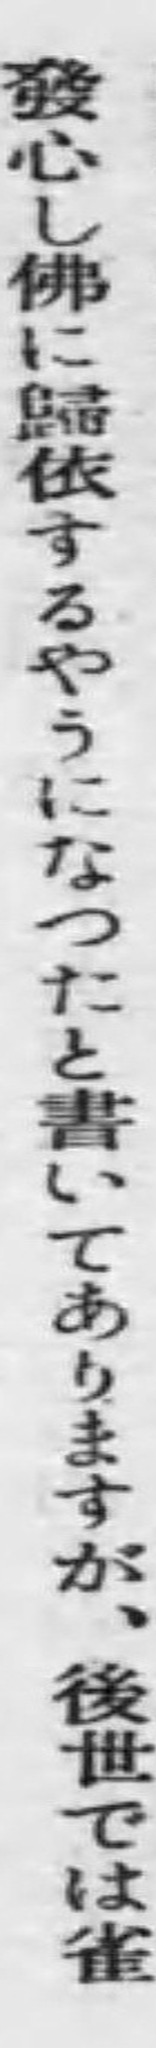発心し仏に帰依するやうになつたと書いてありますが、後世では雀
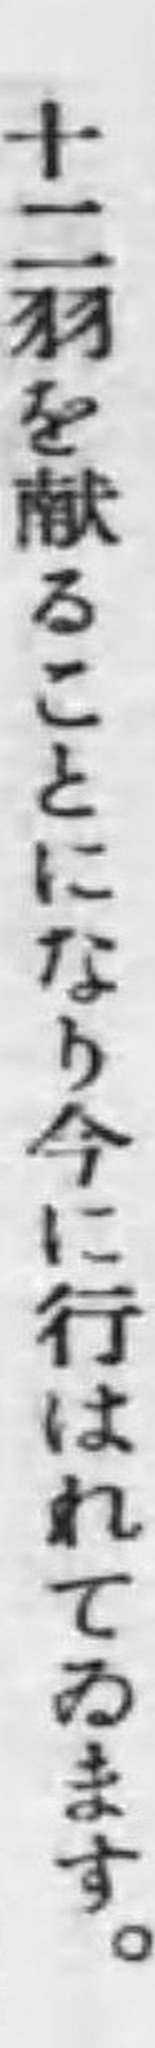十二羽を献ることになり今に行はれてゐます。
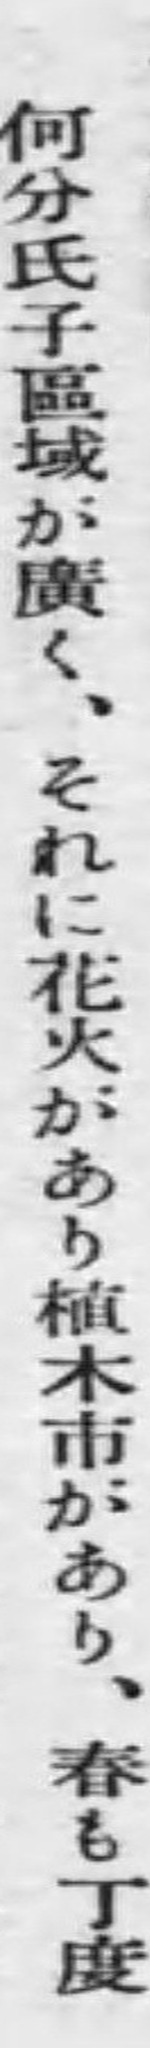何分氏子区域が広く、それに花火があり植木市があり、春も丁度
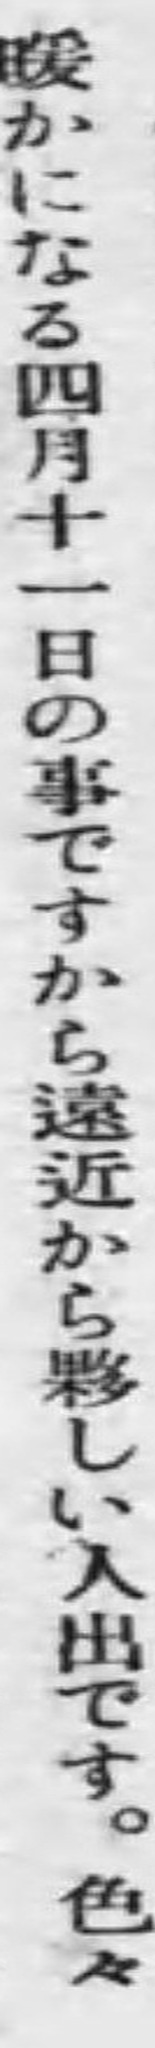暖かになる四月十一日の事ですから遠近から夥しい人出です。色々
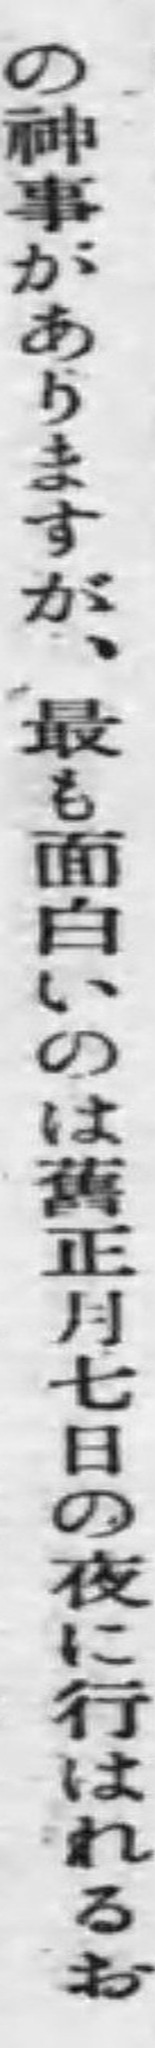の神事がありますが、最も面白いのは旧正月七日の夜に行はれるお
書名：東三河道中記 : 豊橋市及其附近案内
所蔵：国立国会図書館 National Diet Library, JAPAN
